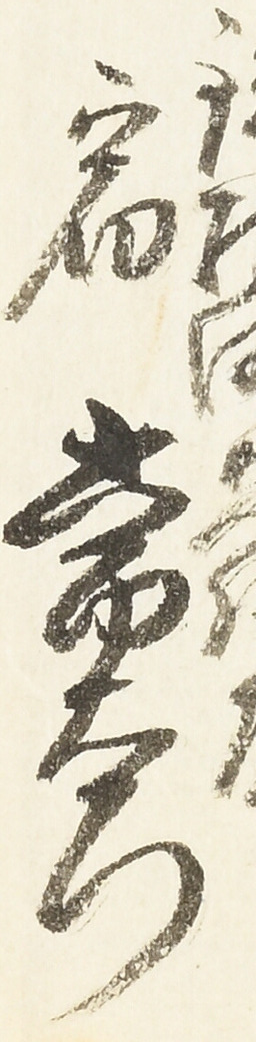宿常右衛門
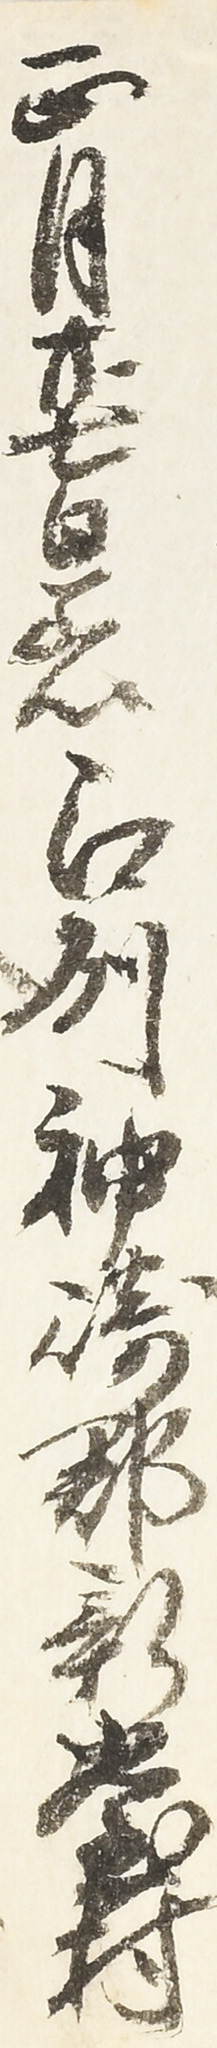正月廿七日着江州神崎郡新堂村
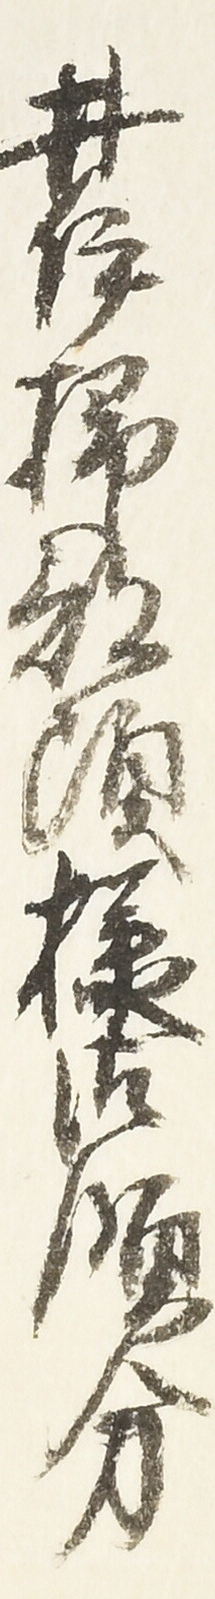井伊掃部頭様御領分
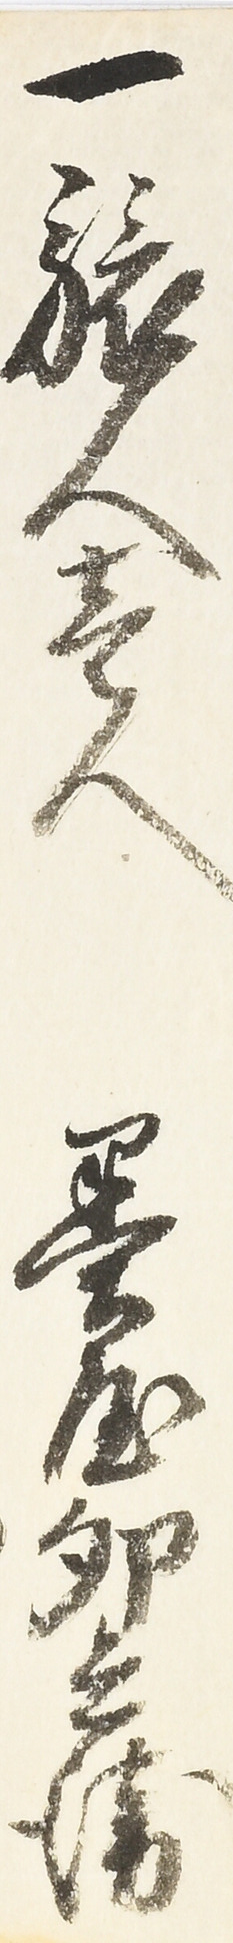一旅人壱人墨屋卯兵衛
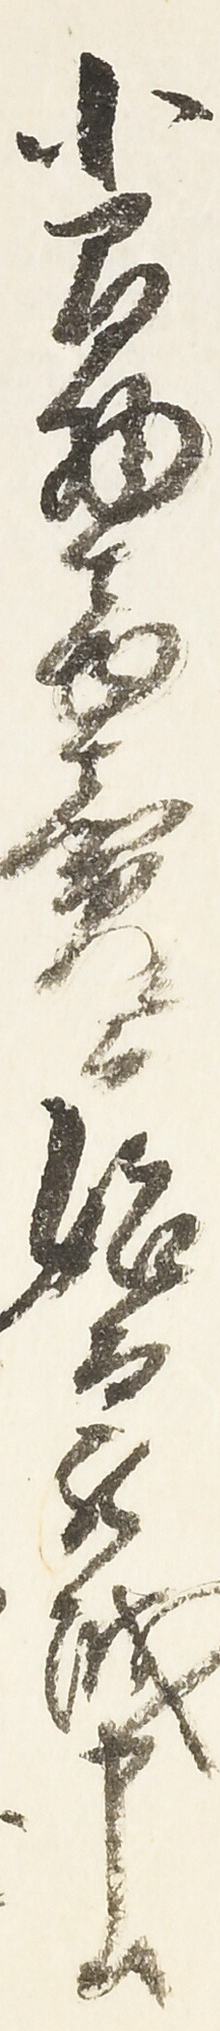小間物商売ニ而始而罷越申候
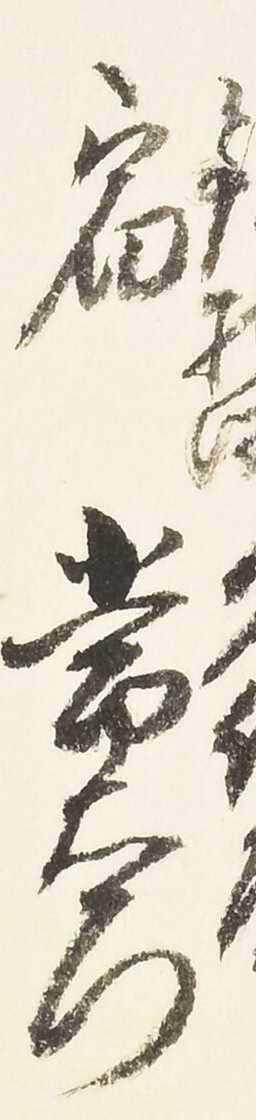宿常右衛門
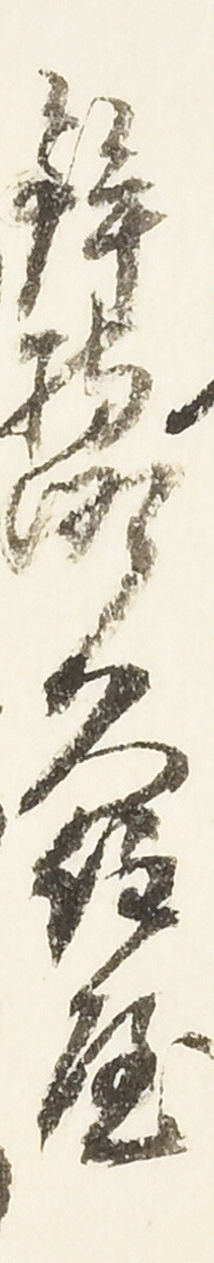鉾持町久住屋
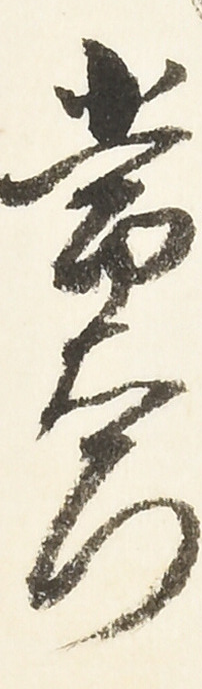宿常右衛門
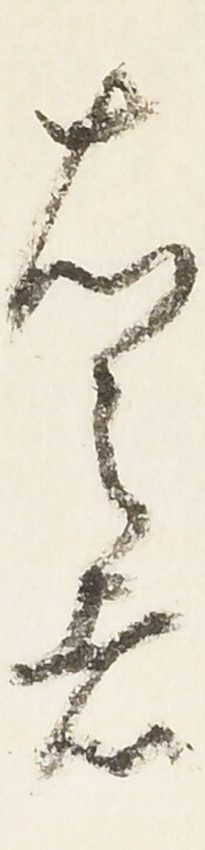右之者
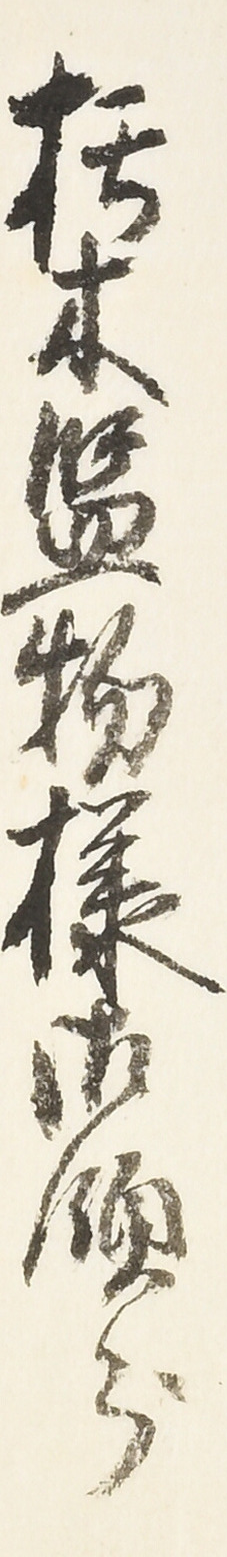朽木監物様御領分
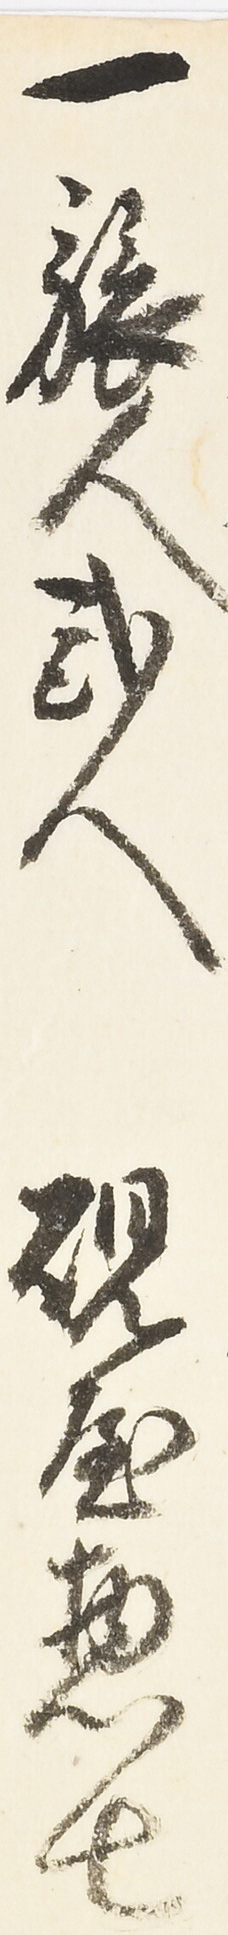一旅人弐人硯屋惣七
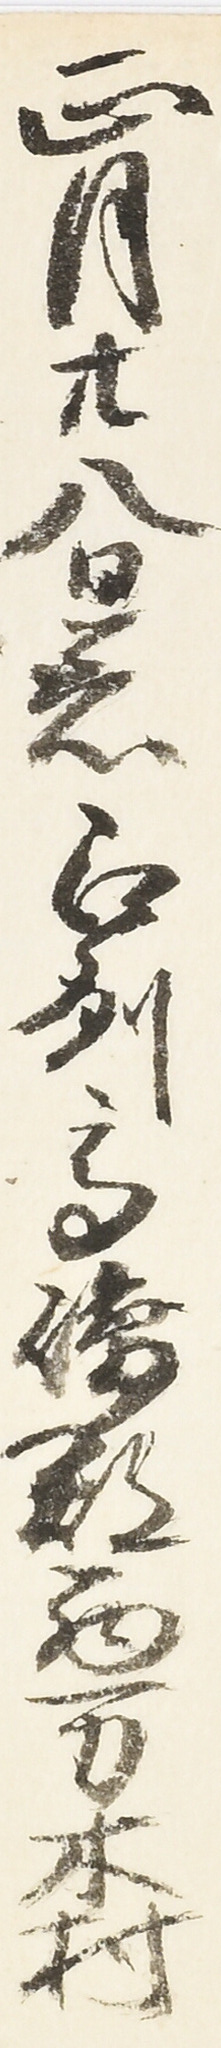正月廿八日着江州高嶋郡西万木村
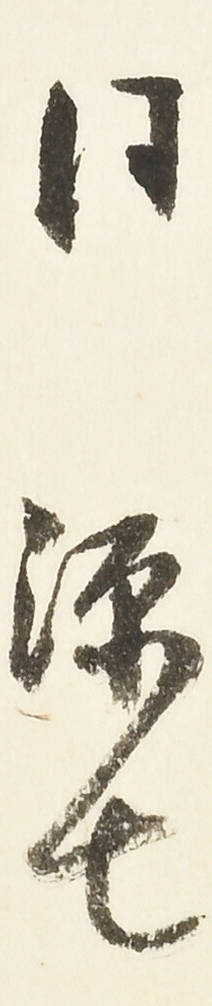同源七
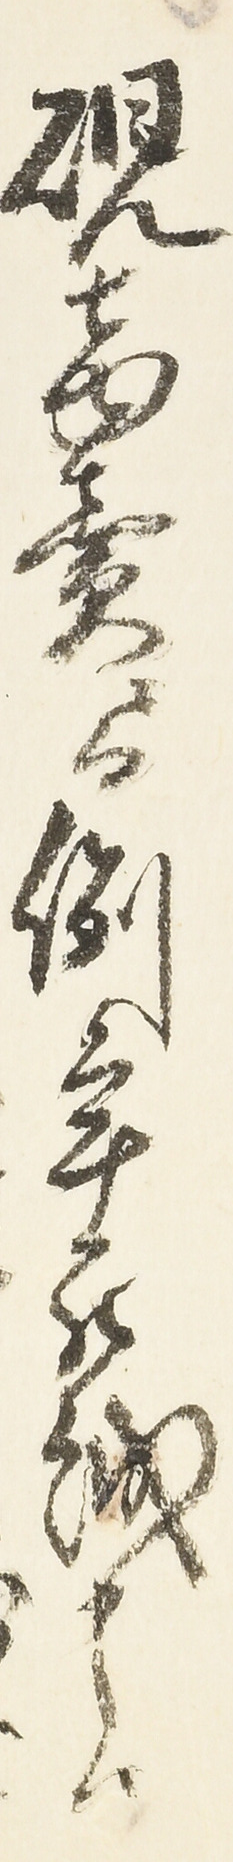硯商売ニ而例年罷越申候
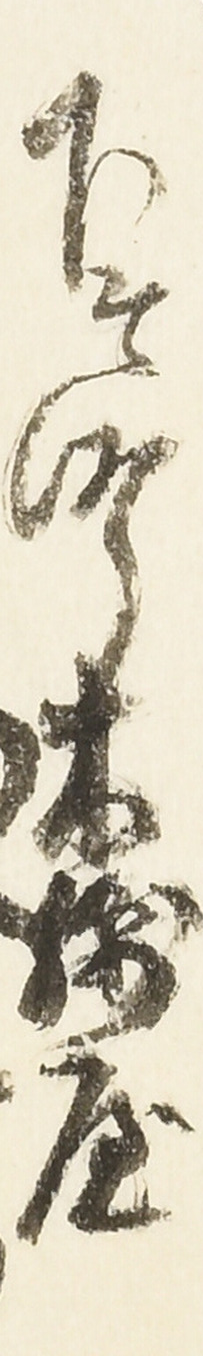下モ町木綿屋
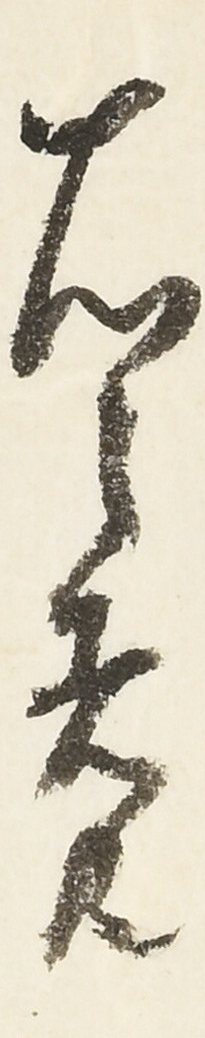右之者共
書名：町中旅人泊控帳
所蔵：伊那市立高遠町図書館・合同会社AMANE
